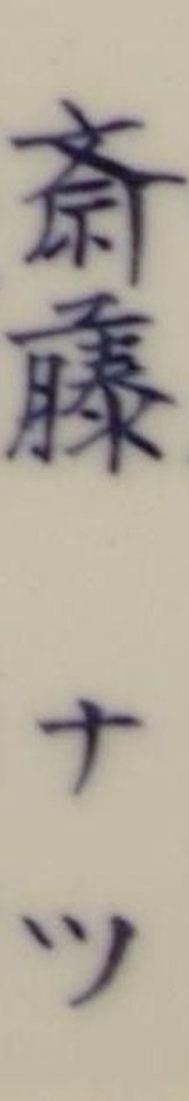斎藤ナツ
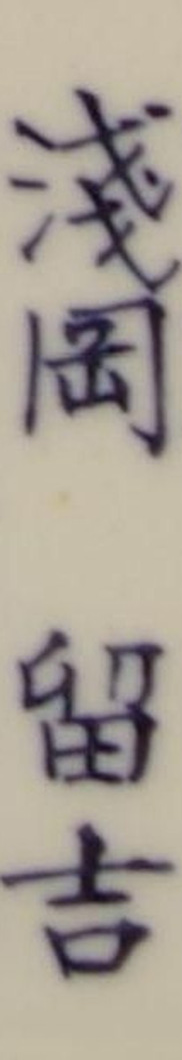浅岡留吉
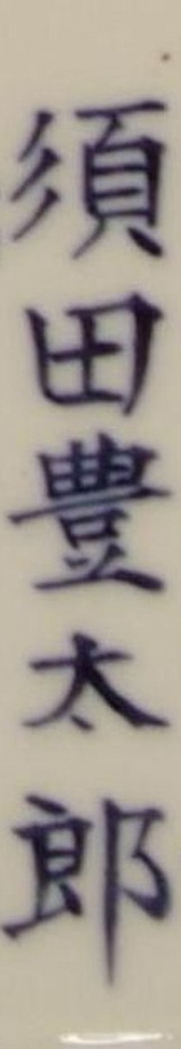須田豊太郎
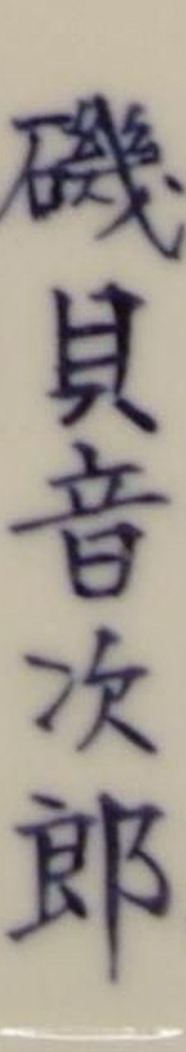磯貝音次郎
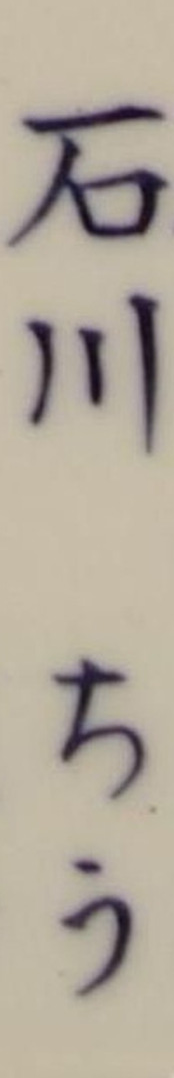石川ちう
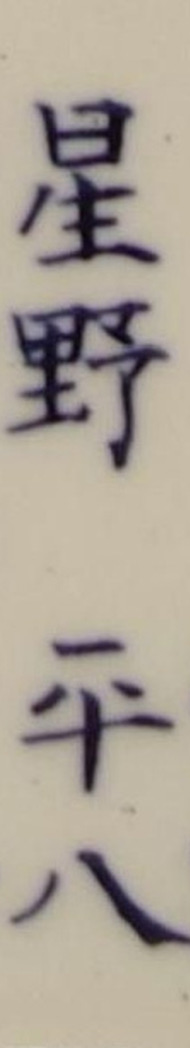星野平八
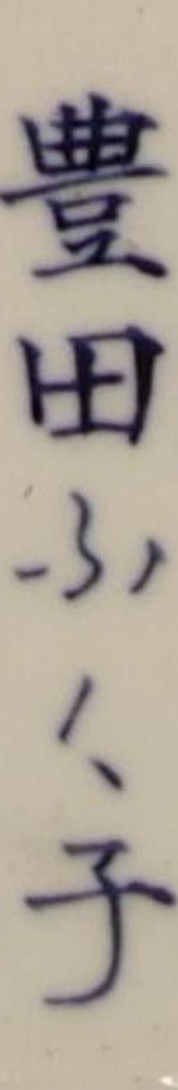豊田ふく子
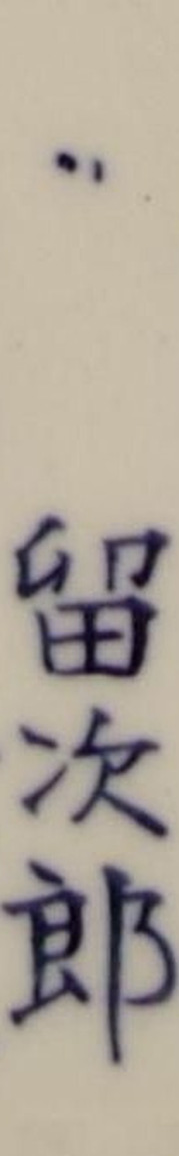留次郎
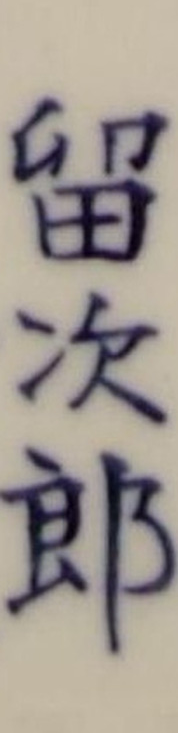留次郎
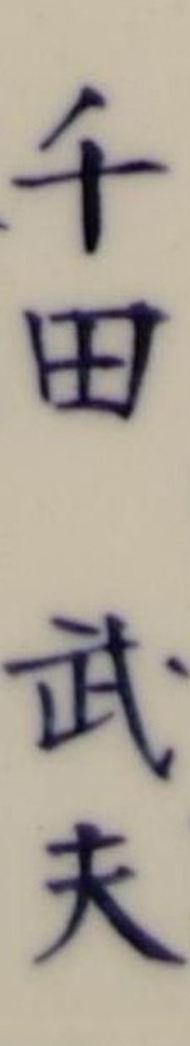千田武夫
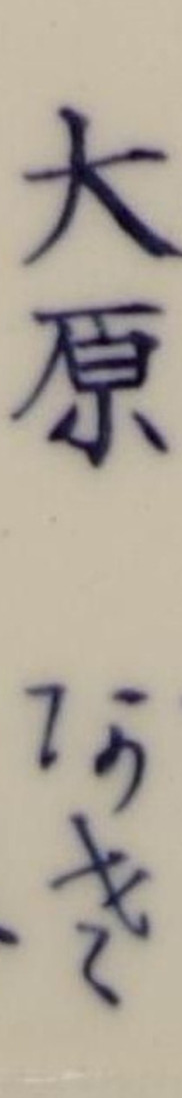大原あさ
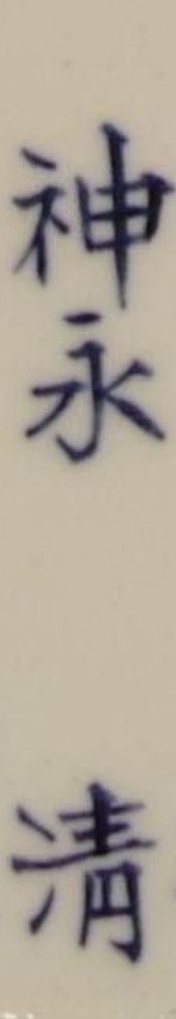神永清
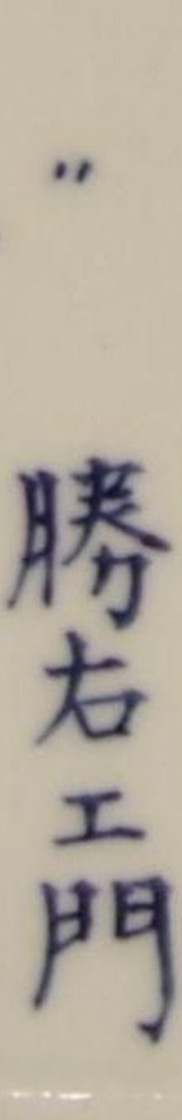勝右エ門
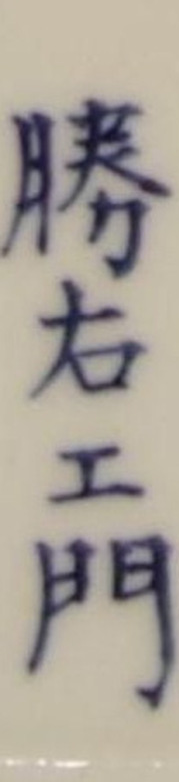勝右エ門
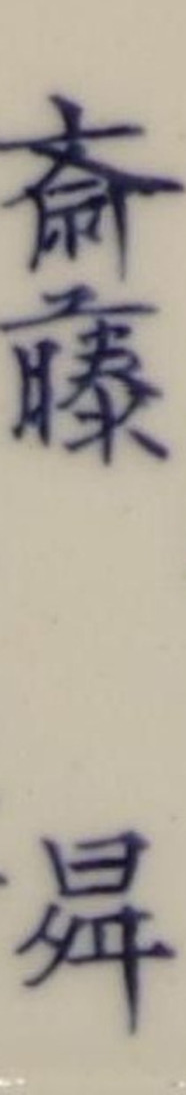斉藤昇
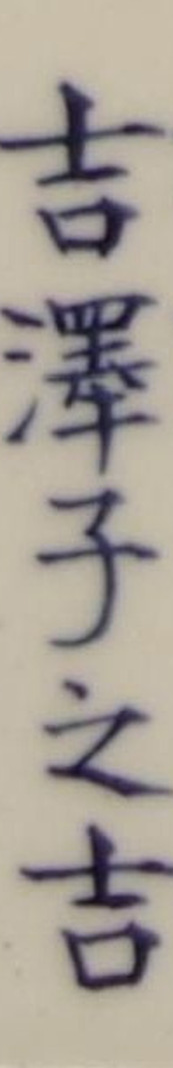吉澤子之吉
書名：E~L
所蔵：高野山金剛峯寺
